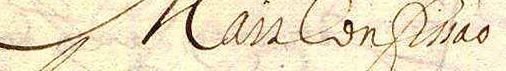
Maiz Confissão
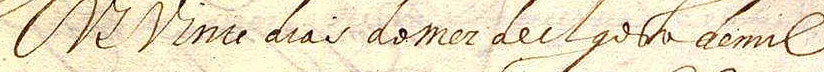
Aoz Vinte dias do mez de Agosto de mil
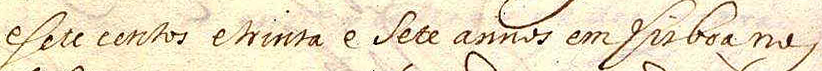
e setecentos e trinta e sete annos em Lisboa nos
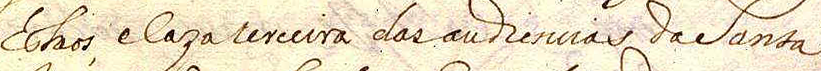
Estaos, e Caza terceira das audiencias da Santa
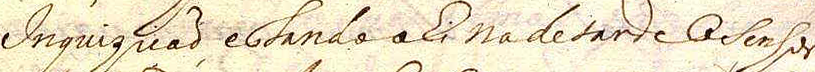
Inquiziçaõ, estando ahi na de tarde O Senhor
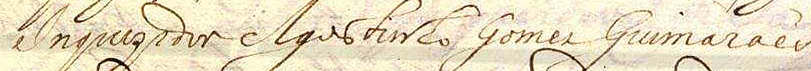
Inquizidor Agostinho Gomez Guimaraẽs
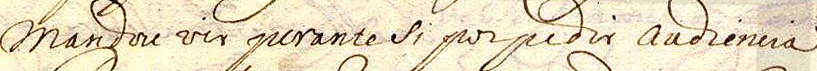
mandou vir perante si por pedir audiencia
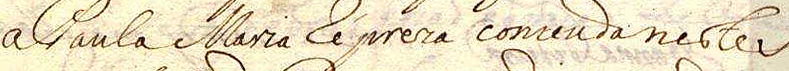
a Paula Maria Ré preza conteuda nestes
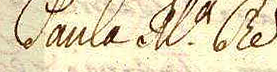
Paula M.a Re
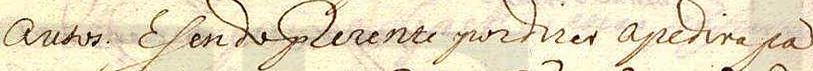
autos. E sendo pRezente por dizer a pedira pa
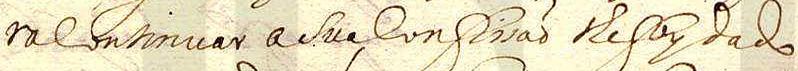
ra continuar a sua Confissaõ lhe foy dado
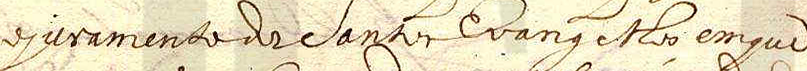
o juramento dos Santos Evangelhos, em que
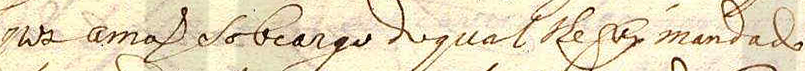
pos a maõ sob cargo do qual lhe foy mandado
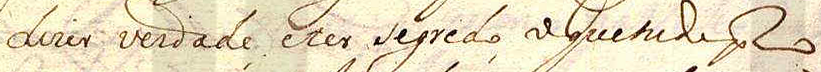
dizer verdade, e ter segredo, o que tudo pRo
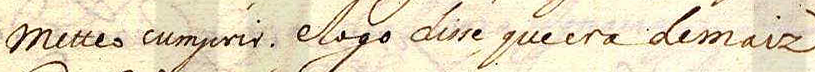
metteo cumprir. e logo disse, que era demaiz
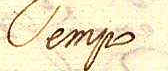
Tempo
